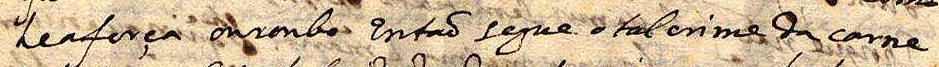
he a força ou roubo Entaõ segue o tal crime da carne
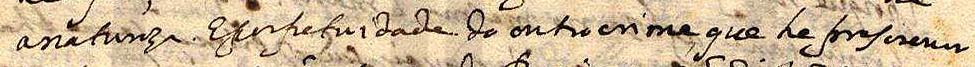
a natureza E perpetuidade do outro crime, que he prescreuer
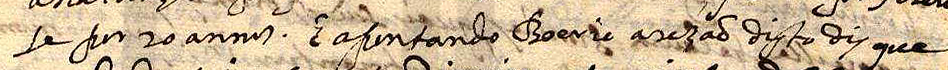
se por 20 annos. E apontando Boeric a rezaõ disto dis que
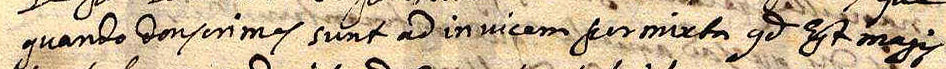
quando dous crimes sunt ad inuicem per mixta qd Est magis
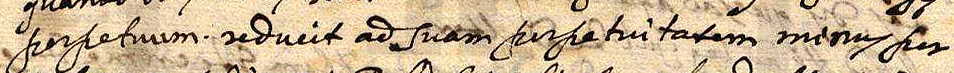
perpetuum reducit ad suam perpetuitatem minus per
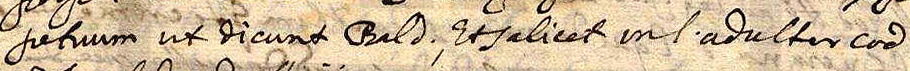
petuum ut dicunt Bald. Et salicet in l. adulter com
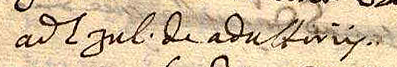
ad l Jul. de adulterius.
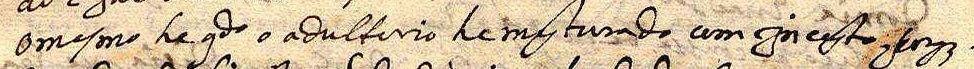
o mesmo he q.do o adulterio he misturado com Jncesto, porqꝫ
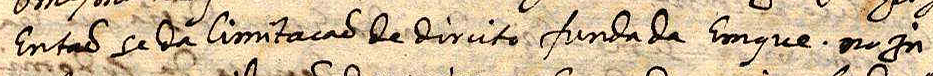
Entaõ se da limitaçaõ de direito fundada Em que no Jn
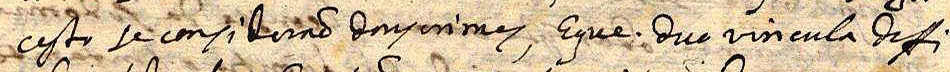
cesto se consideraõ dous crimes, E que duo vincula deffi
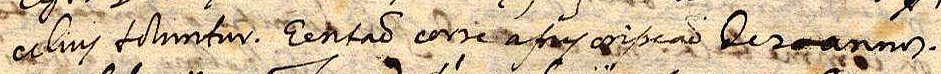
celius toluntur. E entaõ corre a prescripçaõ de 20 annos.
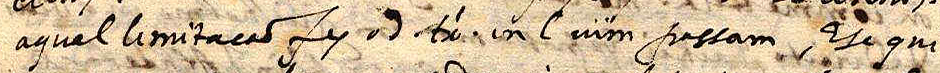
a qual limitaçaõ fes o d. tr̄. in l uim passam, E se qui
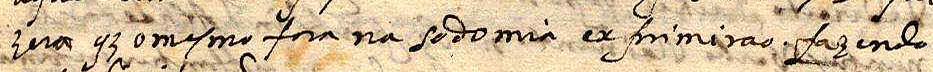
zera qꝫ o mesmo fora na sodomia exprimirao fazendo
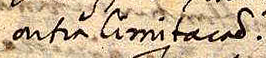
outra limitaçaõ.
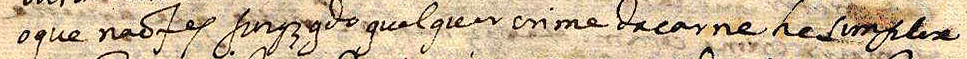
o que naõ fes perqꝫ qdo qualquer crime da carne he simplex
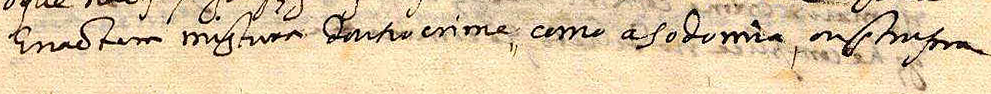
E naõ tem mistura doutro crime, como a sodomia, ou strupra
